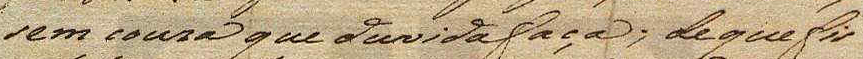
sem couza que duvida faça; de que fis
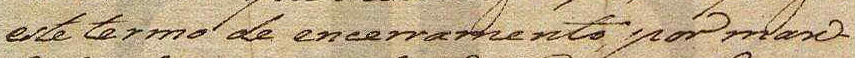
este termo de encerramento, por man
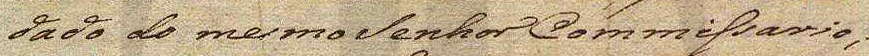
dado do mesmo senhor Commissario,
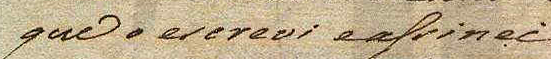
que o escrevi e assinei
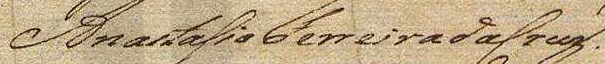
Anastasio Ferreira da Cruz
